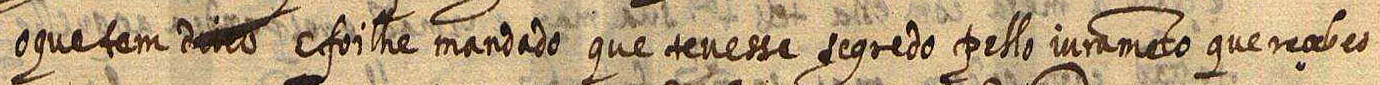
o que tem ditto E foi lhe mandado que teuesse segredo pello iuramēto que reçebeo
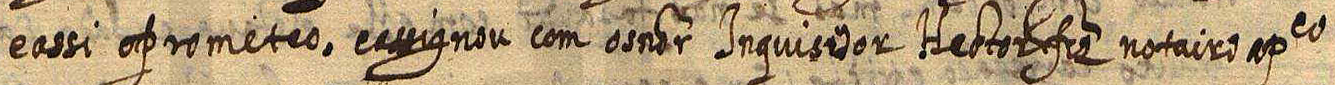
e assi o prometeo, e assignou com o snōr Inquisidor Hector fr̄z notairo apco
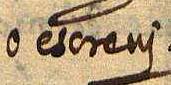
o escreuj.
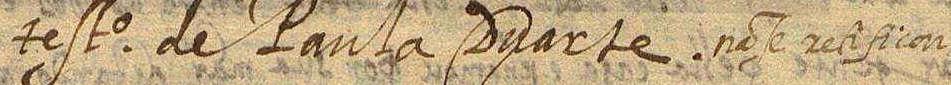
testo. de Paula Duarte. nā se retificou.
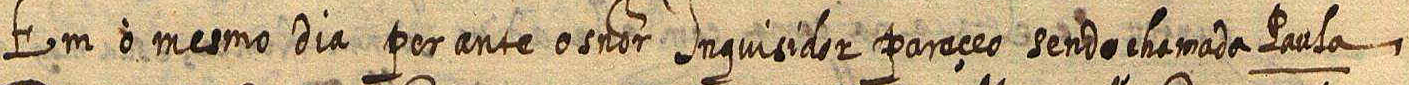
Em o mesmo dia perante o snōr Inquisidor pareçeo sendo chamada Paula
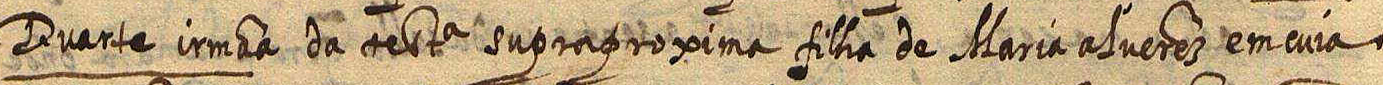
Duarte irmāa da testa supra proxima filha de Maria aluerēz em cuia
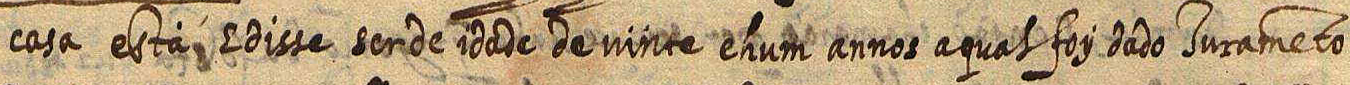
casa está E disse ser de idade de uinte e hum annos a qual foy dado Iuramēto
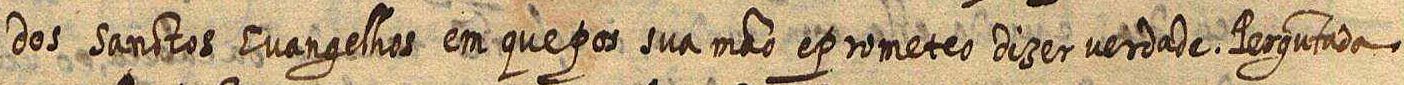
dos sanctos Euangelhos em que pos sua mão e prometeo dizer uerdade. Pergūtada
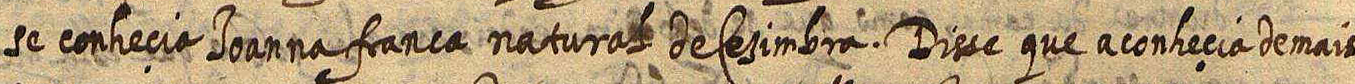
se conheçia Ioanna franca natural de Cezimbra. Disse que a conheçia de mais
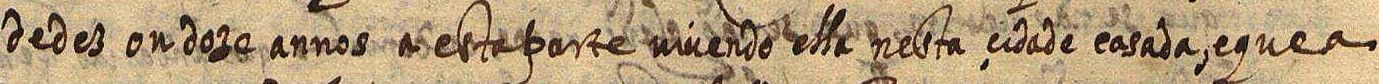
de dez ou doze annos a esta parte uiuendo ella nesta çidade casada, e que a
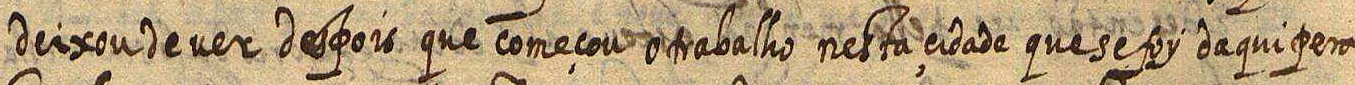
deixou de uer despois que começou o trabalho nesta çidade que se foy daqui pera
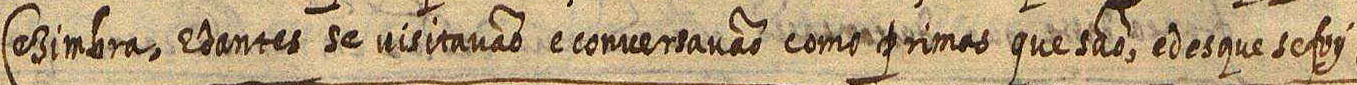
Cezimbra, E dantes se uisitauão e conuersauão como primas que são, e des que se foy
